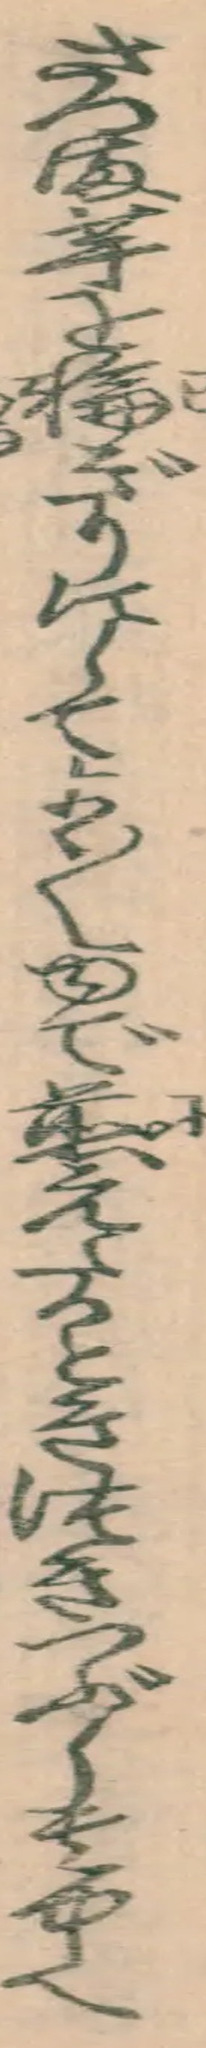さつま芋を輪ぎりにしてよく〳〵ゆで煎えたるときつきつぶし其中へ
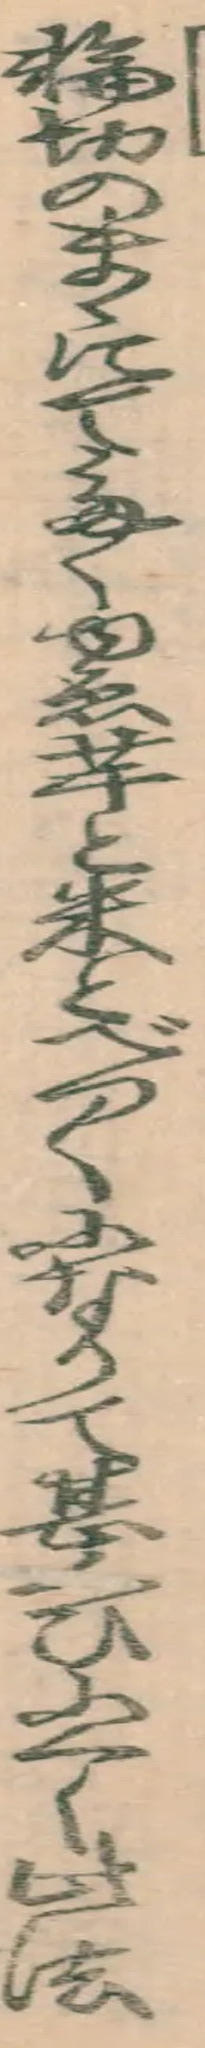輪切のまゝにてたくゆゑ芋と米とべつ〳〵になりて．甚くひにくし此法
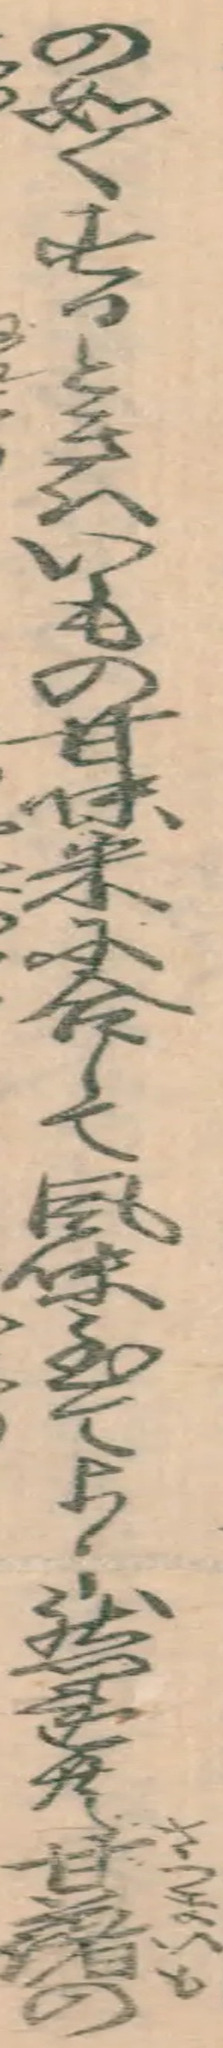の如くするときはいもの甘味米に合して風味至てよし然れ共甘藷の
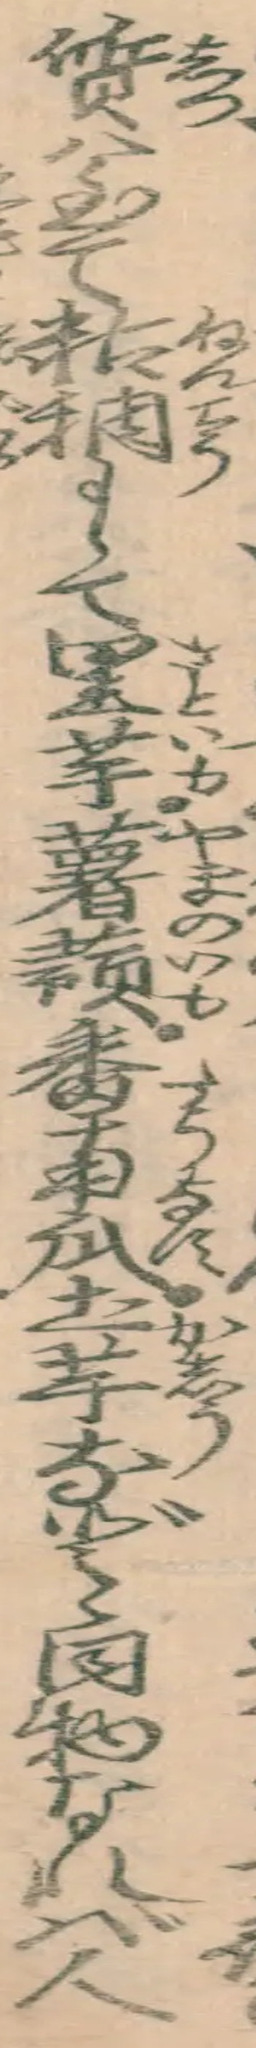質は至て粘稠にして里芋．薯蕷．番南瓜．土芋などゝ同物なれば人
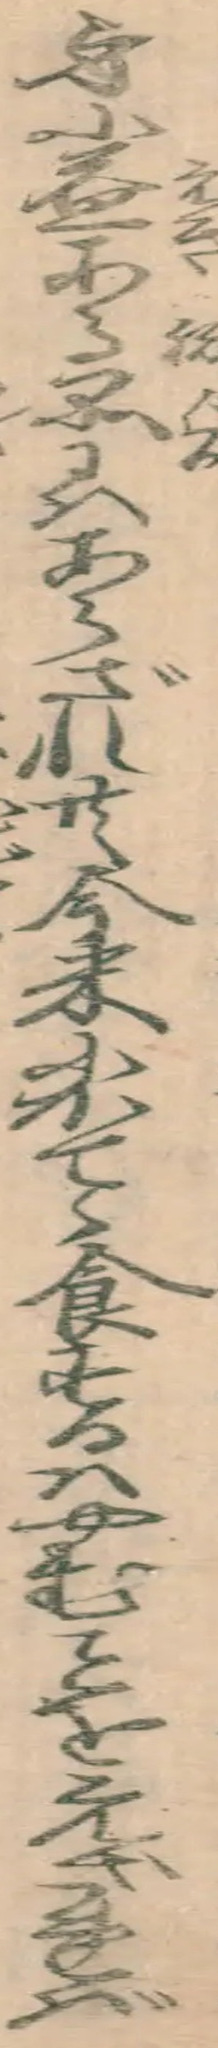身に益ある品にはあらざれ共今米にかてゝ食するはやむことをえざれば
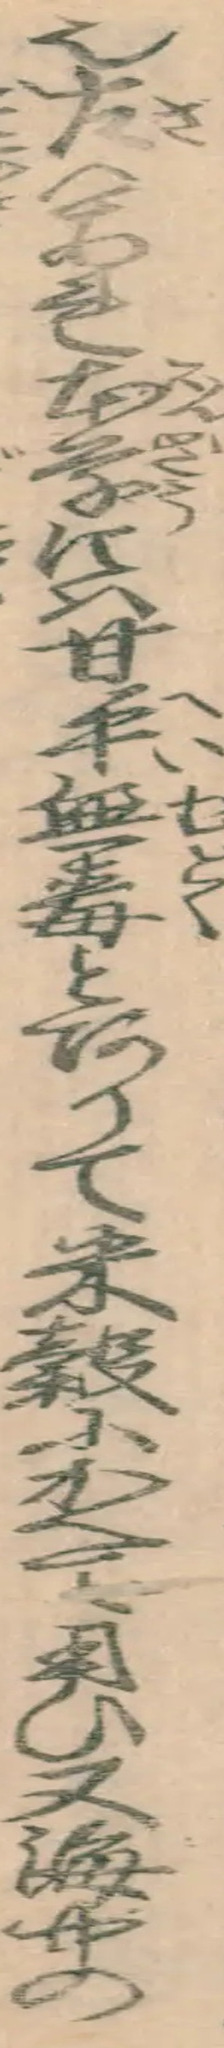也左はあれ本草には甘平無毒とありて米穀にかへて用ひ又海中の
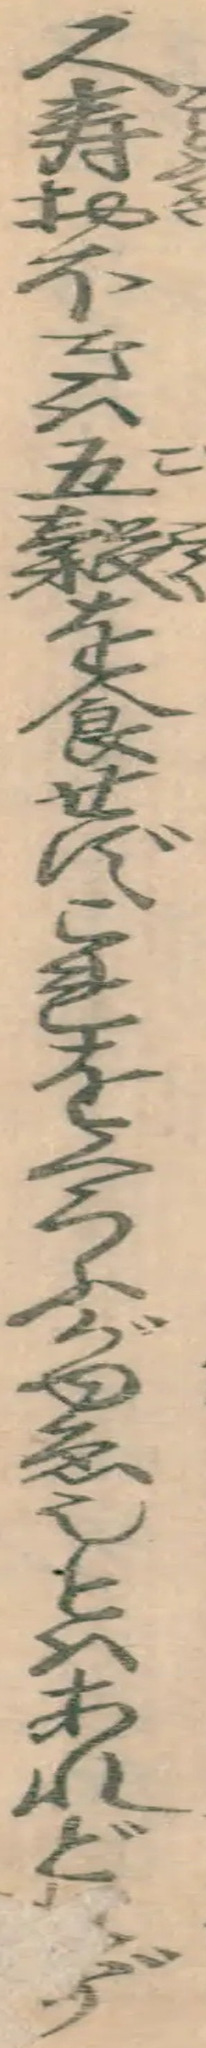人寿おほきは五穀を食せずこれをくらふがゆゑ也とはあれどねばり

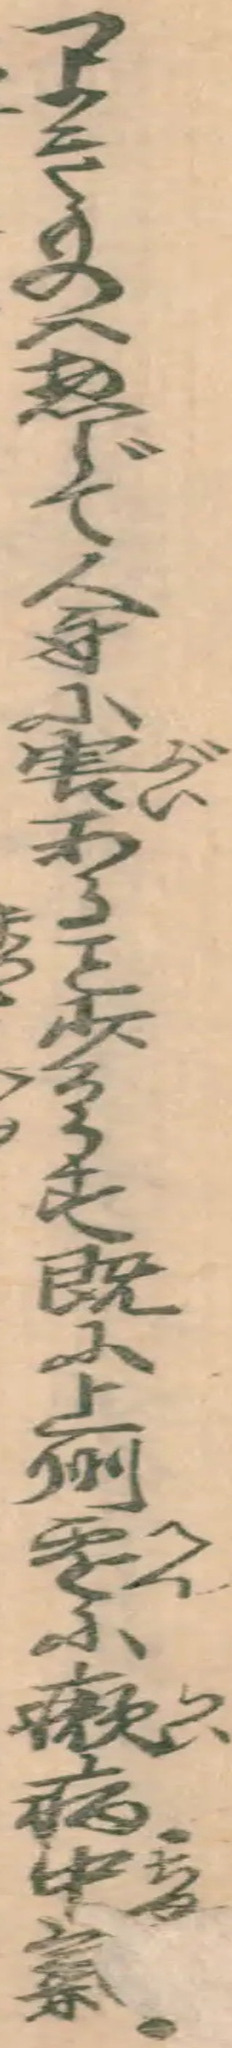つよきものは惣じて人身に害あること少からす既に上州辺に癩病．中気．
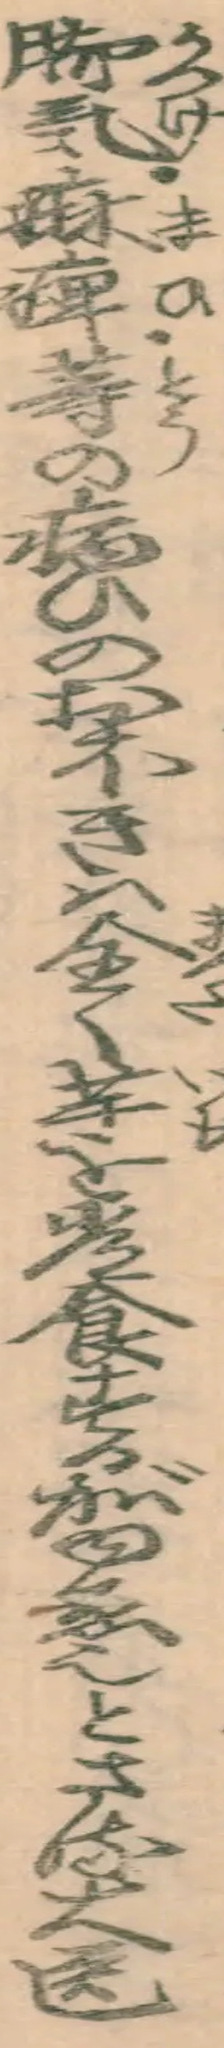脚気．麻痺．等の病ひのおほきは全く芋を常食するがゆゑ也とさる大医
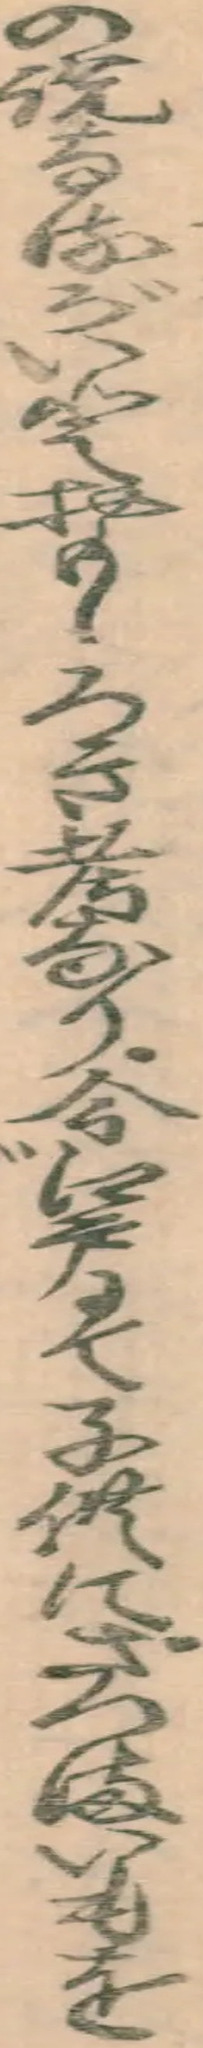の説なるがいとおもしろき考なり．今江戸にて子供に．さつまいもを
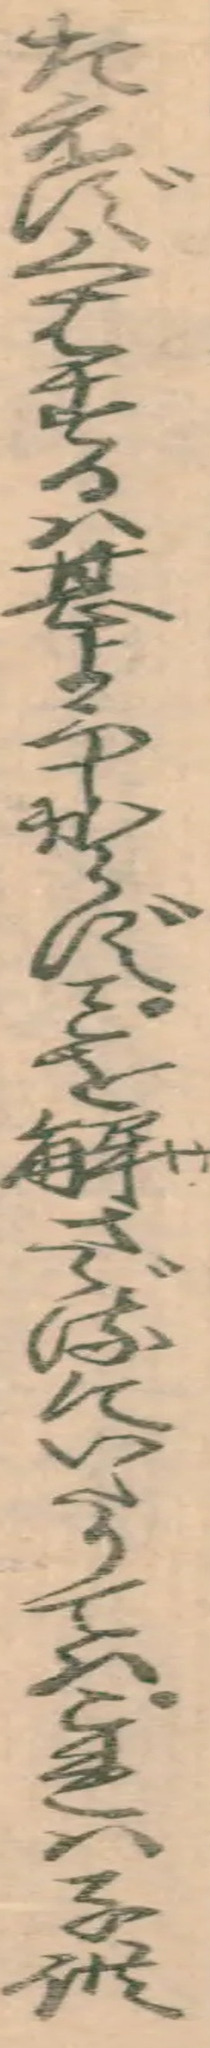たえずくはするは甚よろしからず．ことを解さゞるにいたりては．これは子供
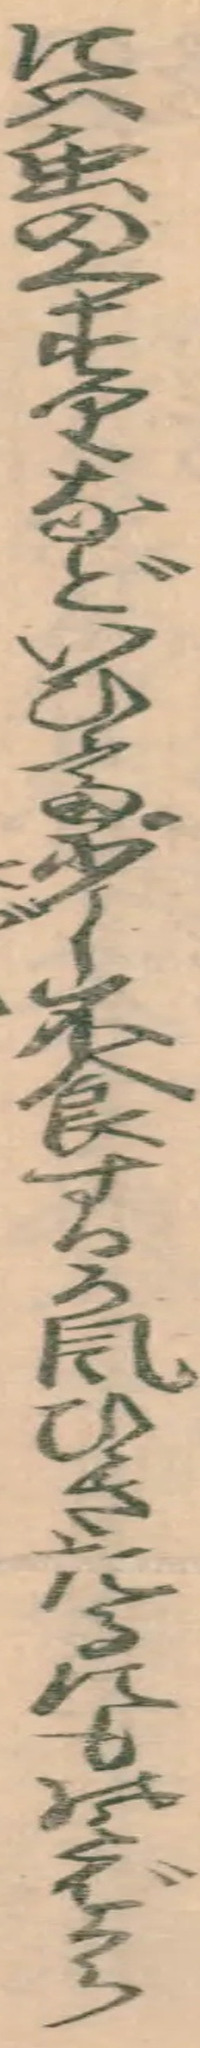には虫のくすりなどいひて．少し不食するか風ひきたるにもそばから
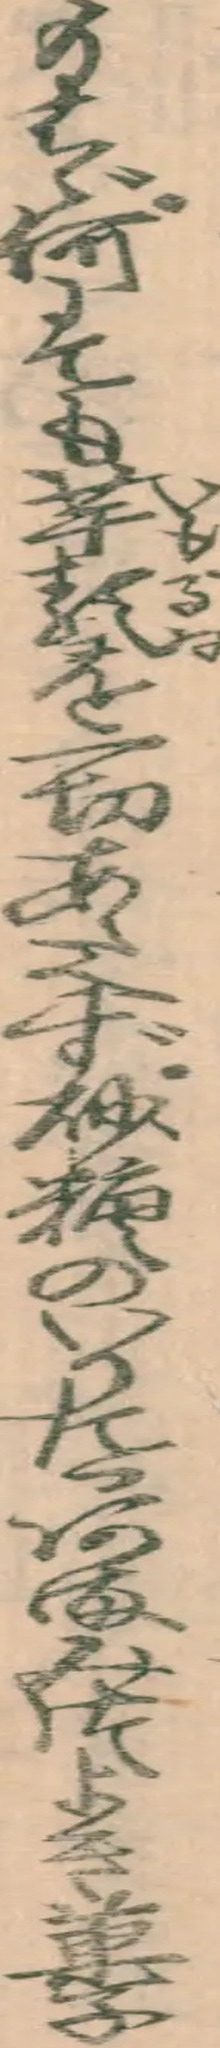もはゞ．何にても芋類を一切あたへず．砂糖のいりたるあまみつよき菓子
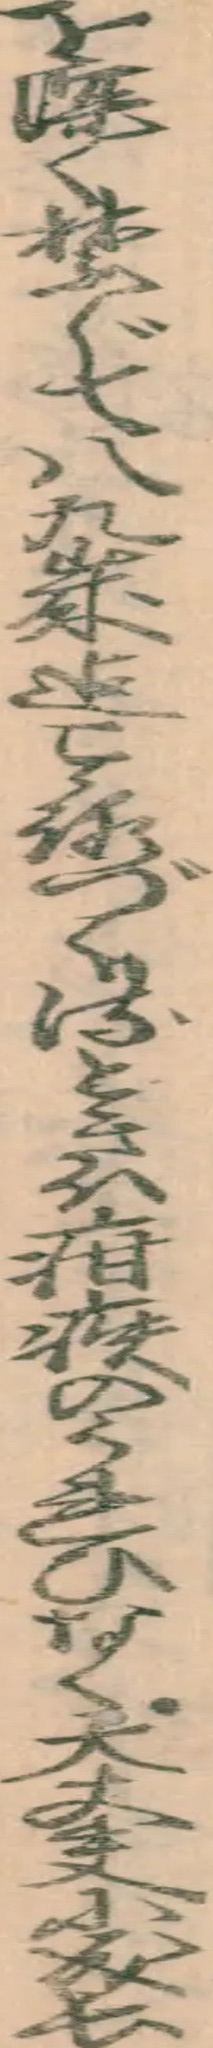を深く禁じて八九歳迄こゝろづくるときは疳疾のうれひなく．大丈夫に成長
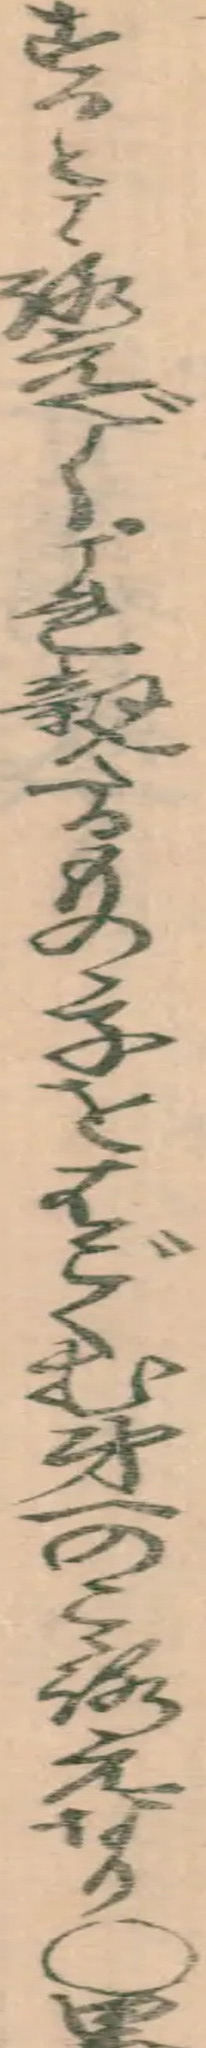するとこゝろえべし．これ親たるものゝ子をはごくむ第一のこゝろえなり○里
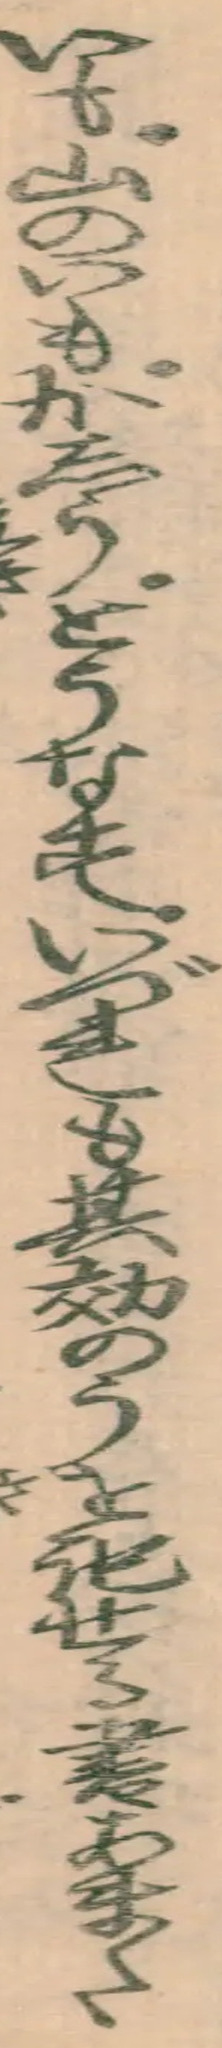いも．山のいも．かしり．とうなす．いづれも其効のうを記せる書あまた
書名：日ごとの心得
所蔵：国立国会図書館 National Diet Library, JAPAN
